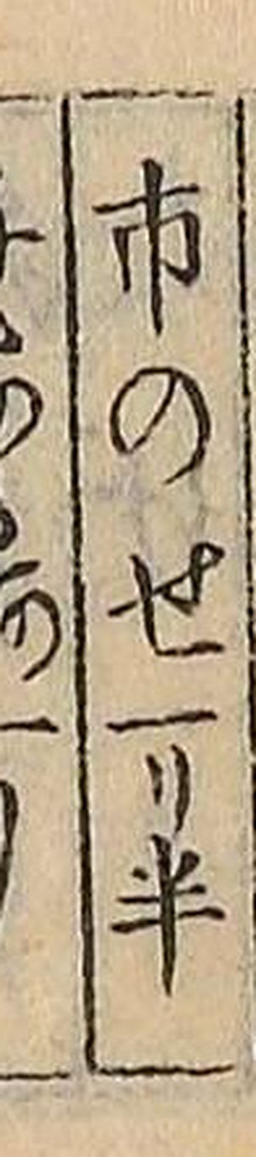子ならあ一リ
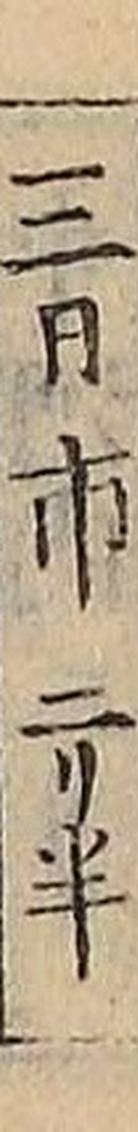三日市二リ半
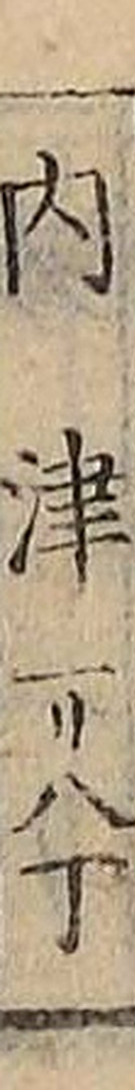内津一リ八丁
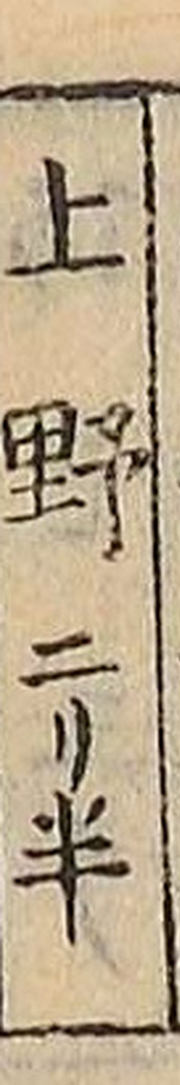上野二リ半
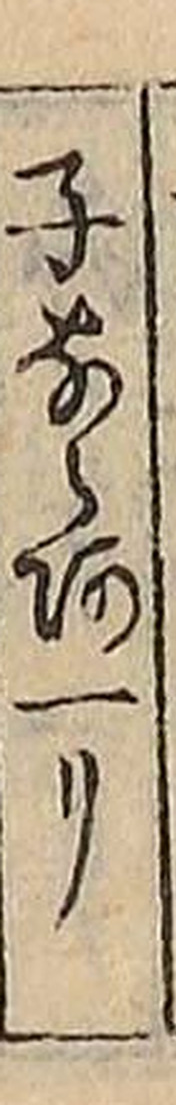子ならあ一リ
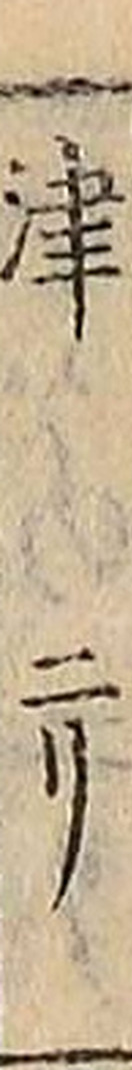津二リ
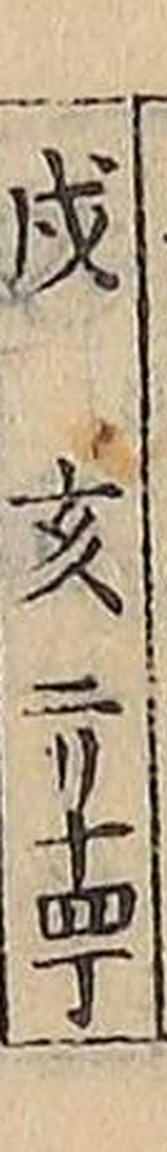戌亥二リ十四丁
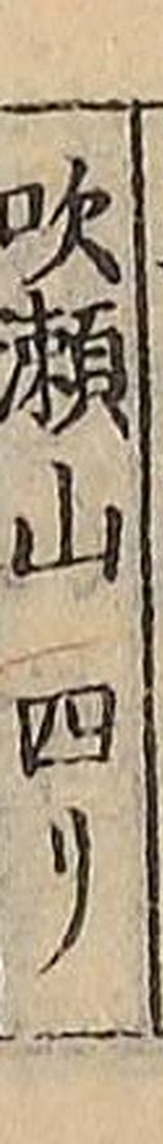吹瀬山四リ
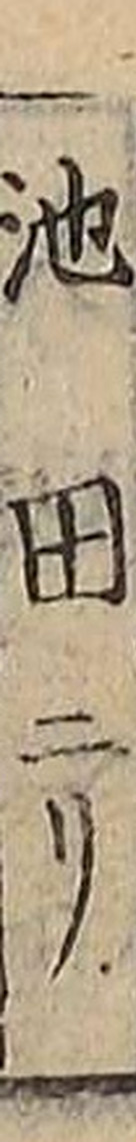池田二リ
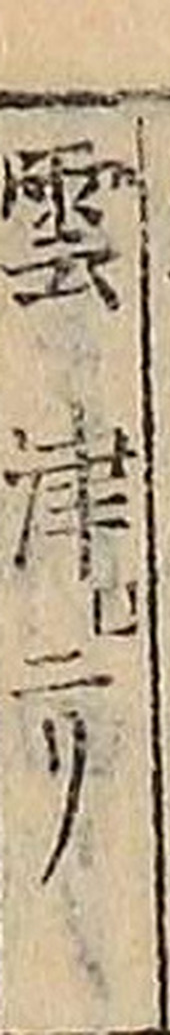雲津▫二リ
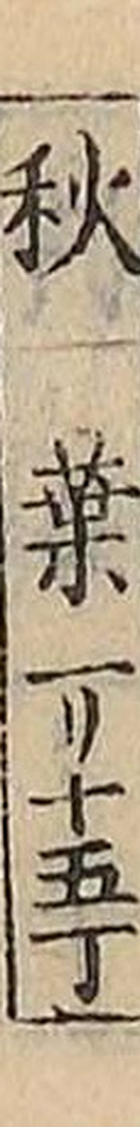秋葉一リ十五丁
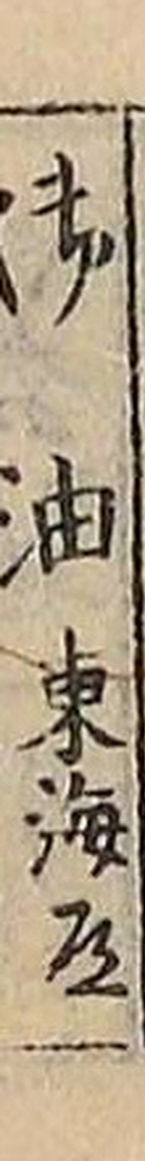御油東海道
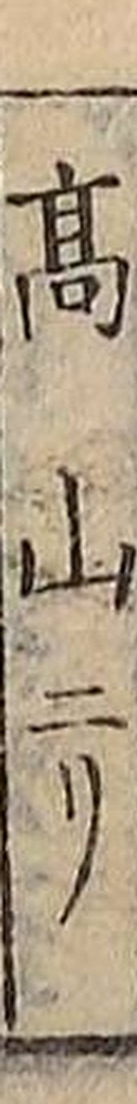高山二リ
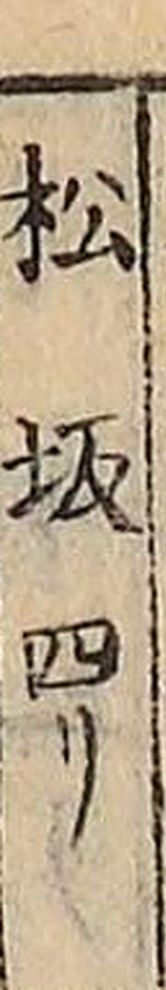松坂四リ
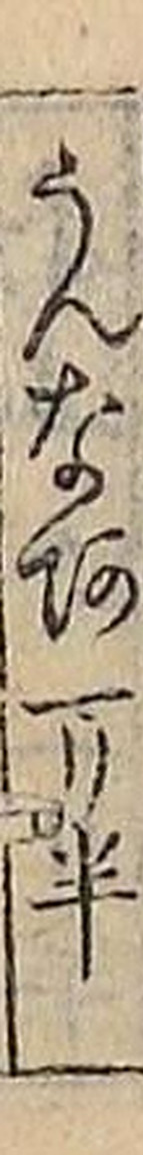うんなあ一リ半
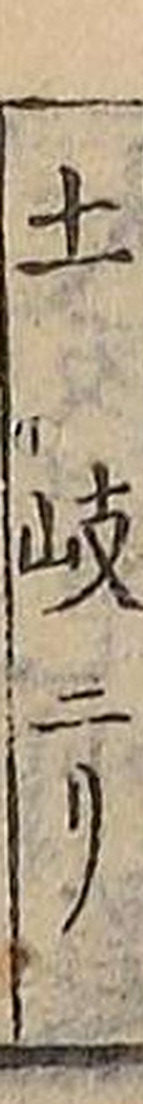土岐二リ
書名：旅行用心集
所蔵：神戸大学附属図書館 国文学研究資料館
